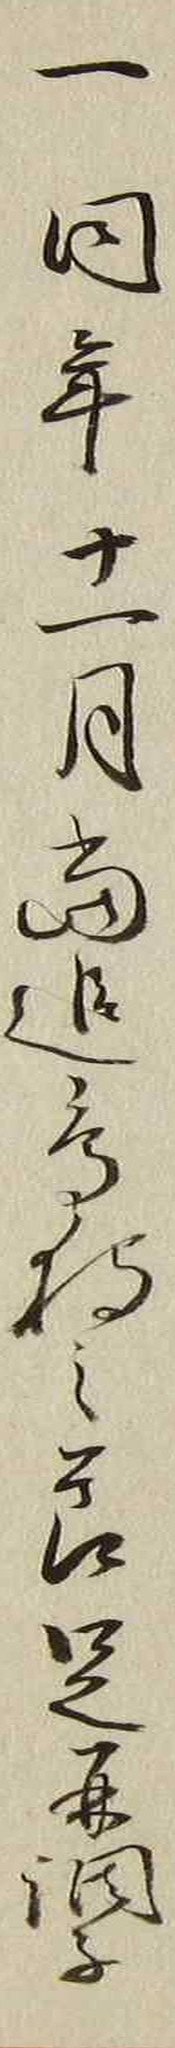一同年十一月当追鳥狩之節足并調子
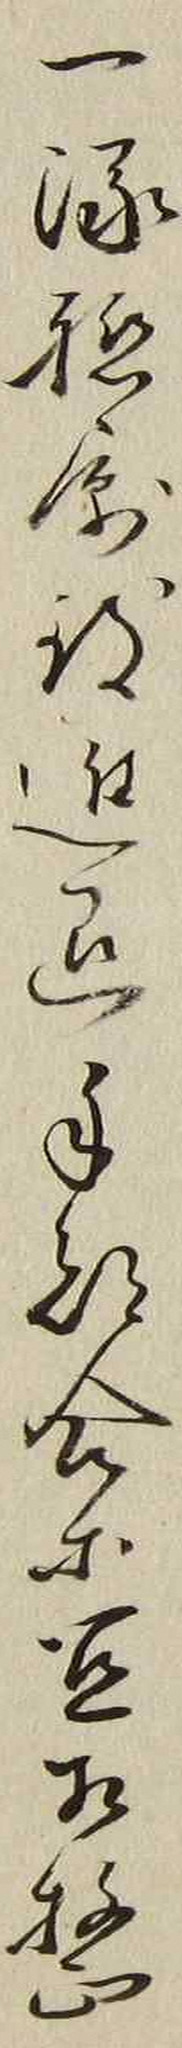一隊聯属致進退手都合等宜相整
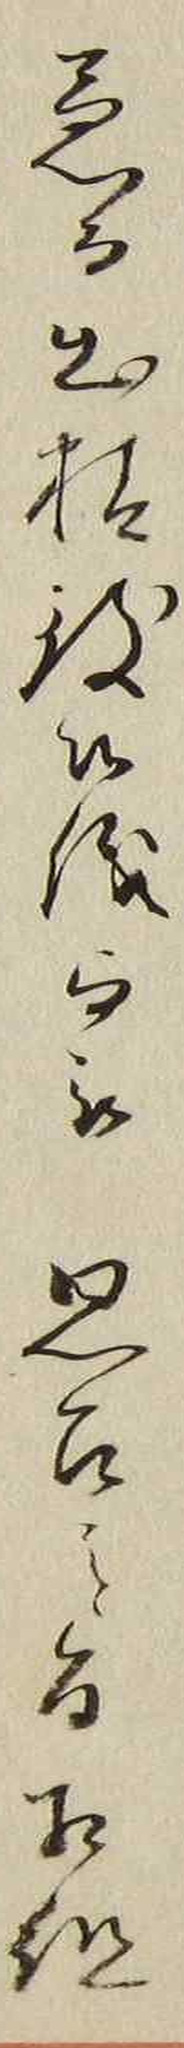兼而出精致候儀与被思召之旨相組
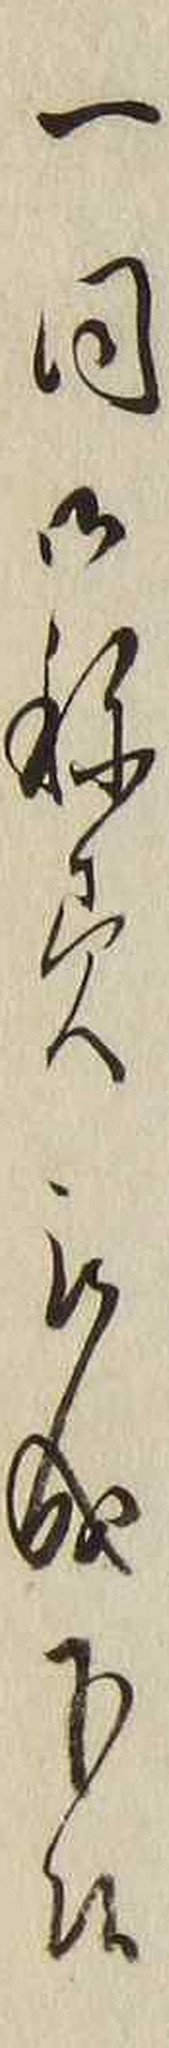一同御称美被成下候

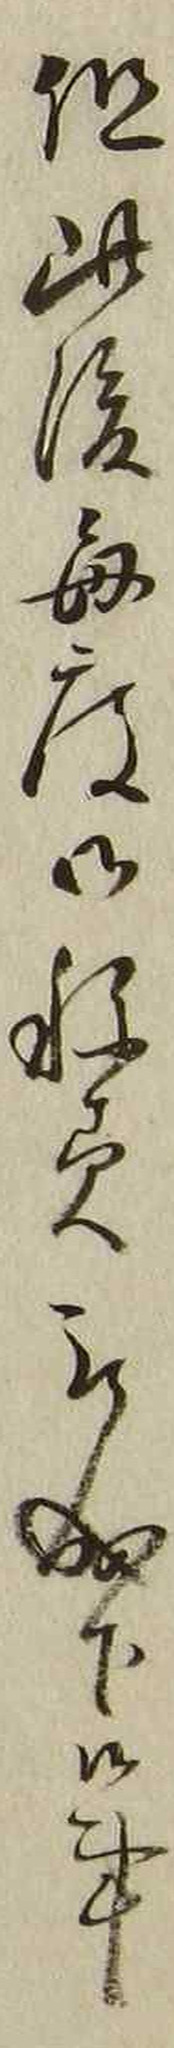但此後毎度御称美被成下候事
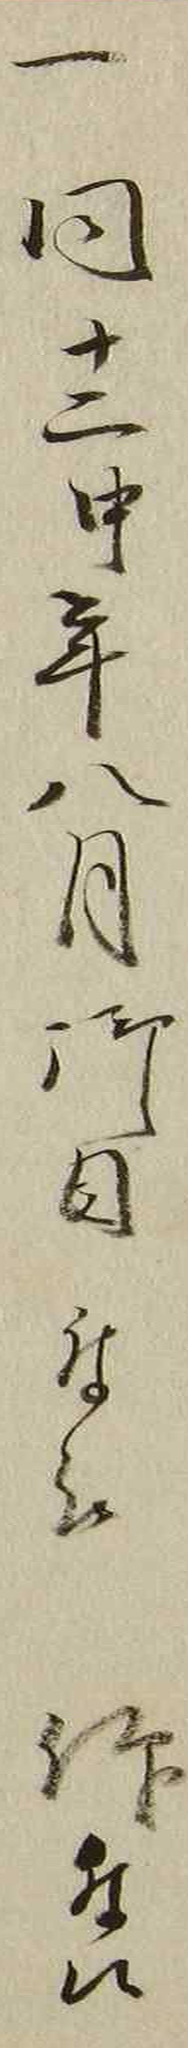一同十二申年八月御目付被仰付候
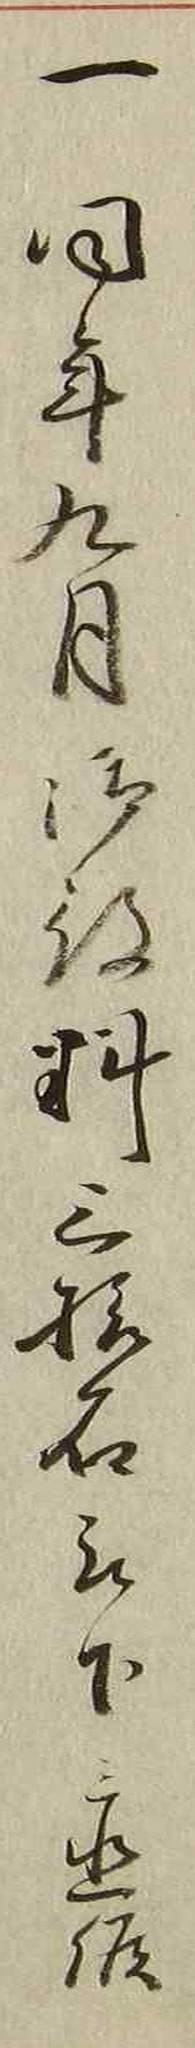一同年九月御役料三拾石被下置候
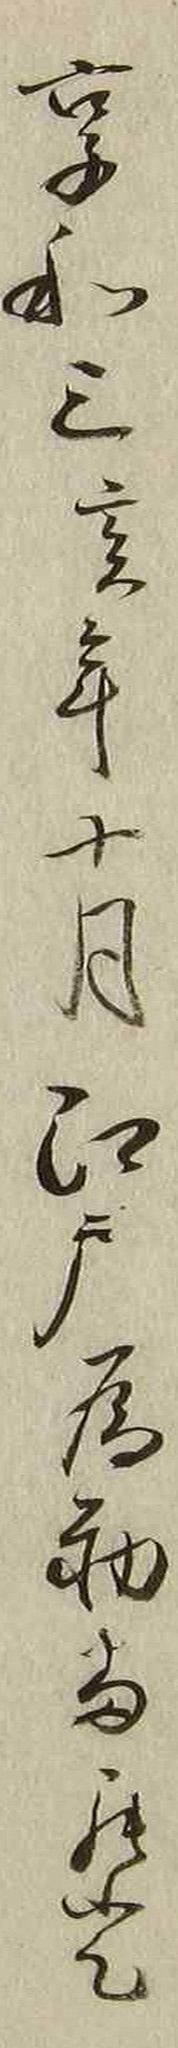享和三亥年十月江戸為勤番罷登
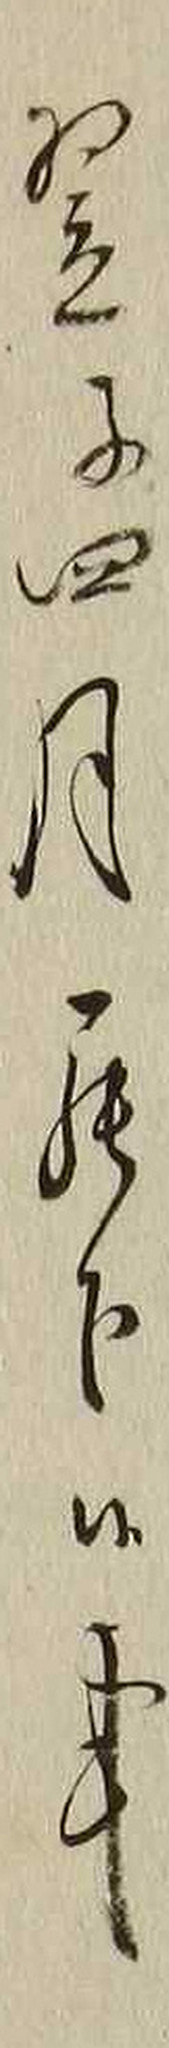翌子四月罷下候事
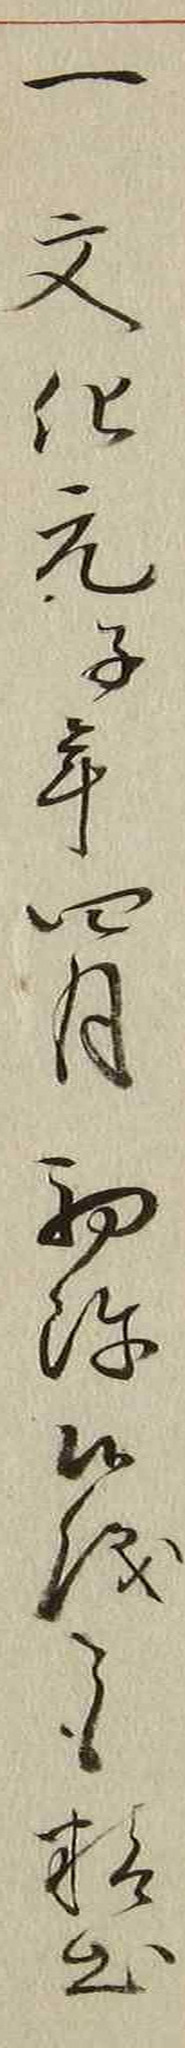一文化元子年四月初陣候儀ニも精出
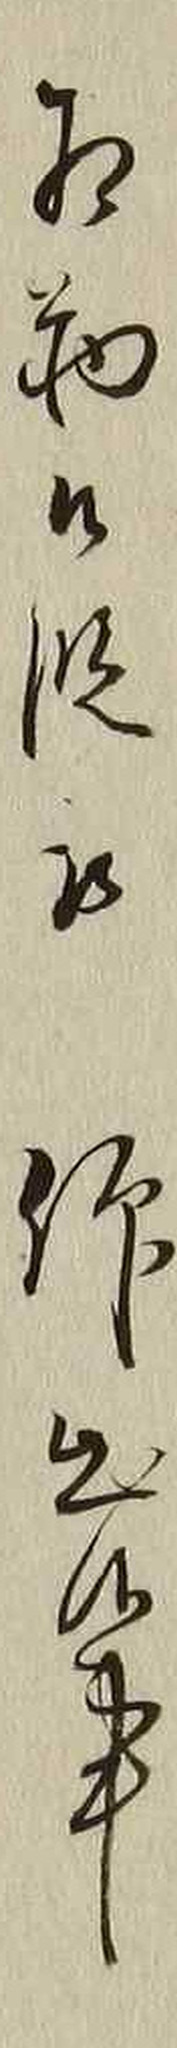相勤候段被仰出候事
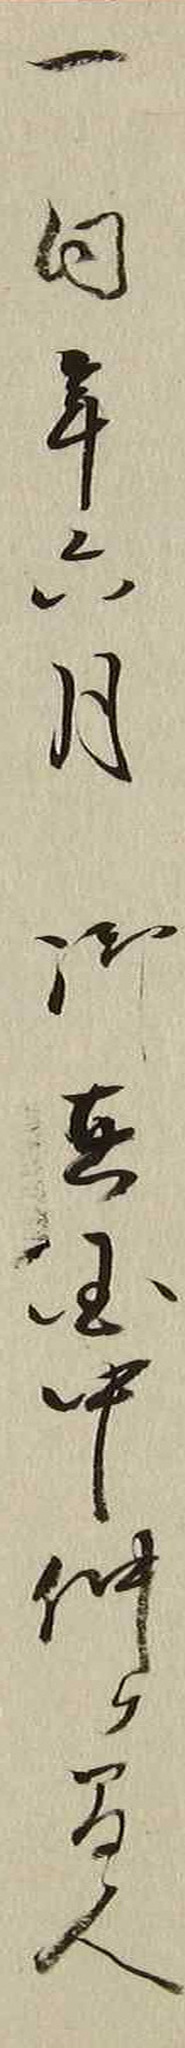一同年六月御在国中仲ケ間人
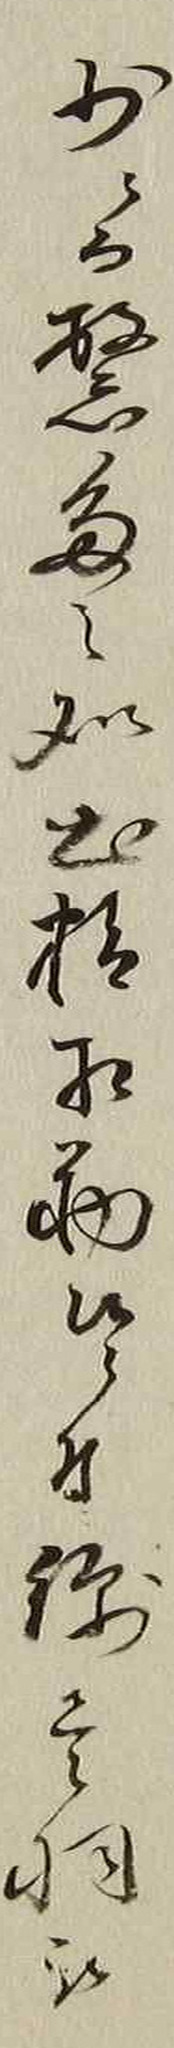少ニ而繁多之処出精相勤候ニ付綿壱羽被
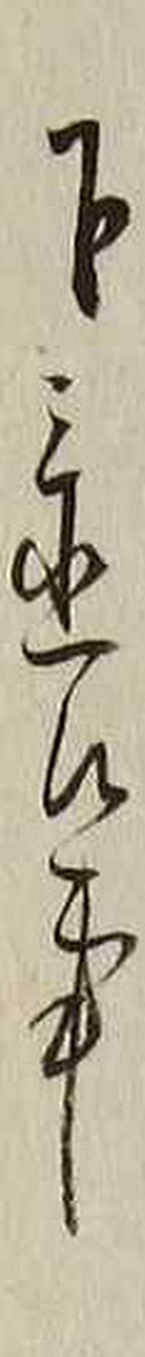下置候事
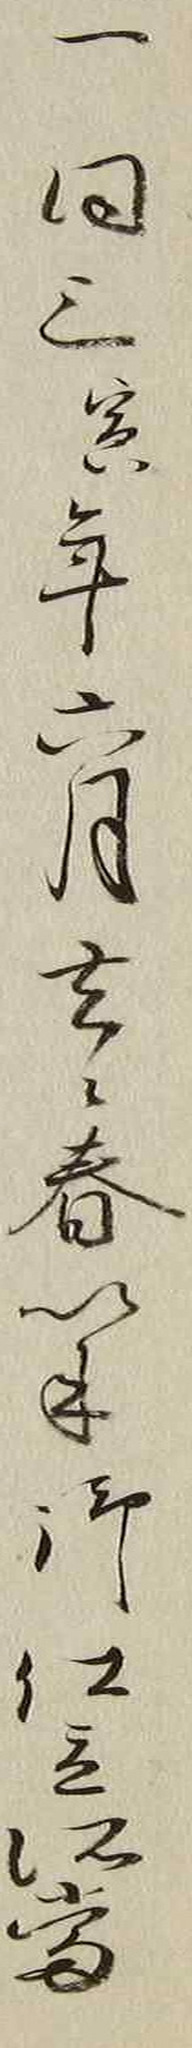一同三寅年六月去々春以来御仕立所当
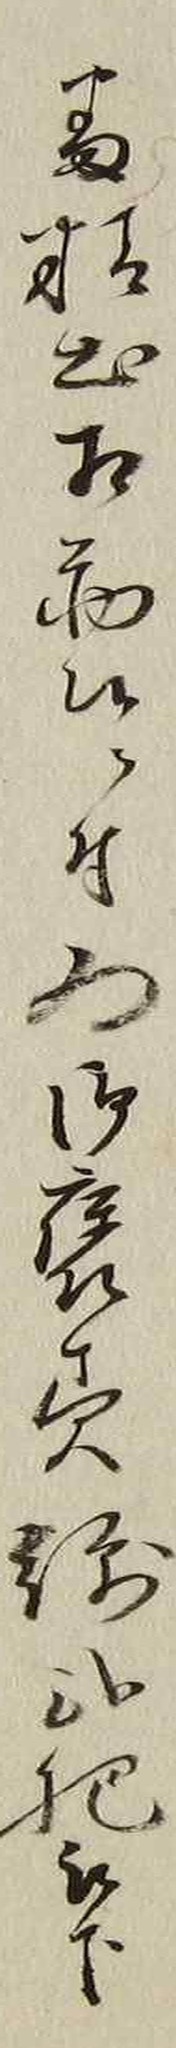番精出相勤候ニ付為御褒美綿弐把被下
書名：諸士系譜　巻之25　い之部25
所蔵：会津若松市立会津図書館
